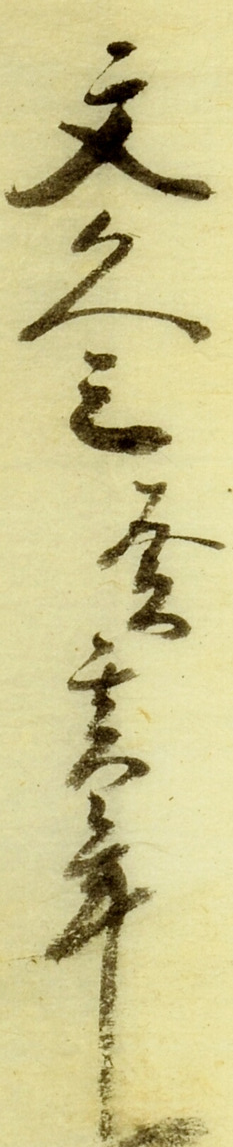文久三癸亥年
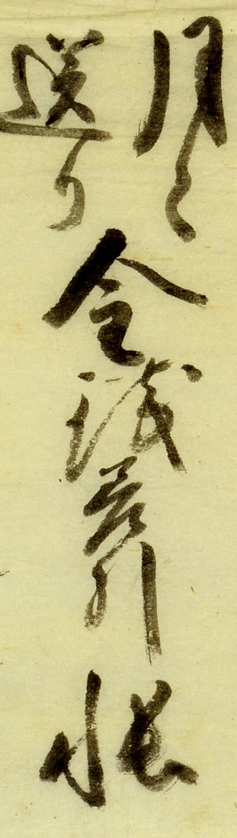送り金銭差引帳
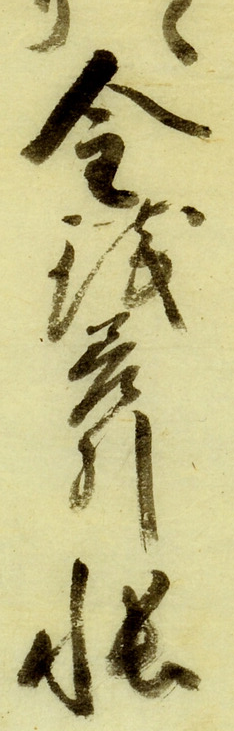送り金銭差引帳
